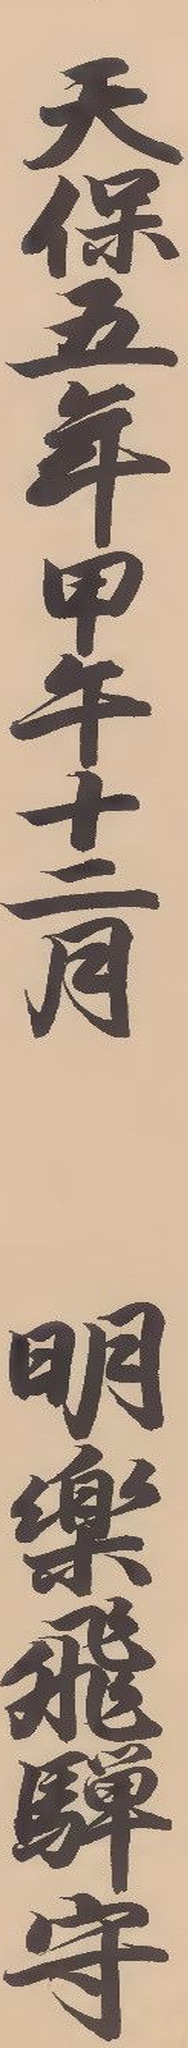天保五年甲午十二月明樂飛騨守
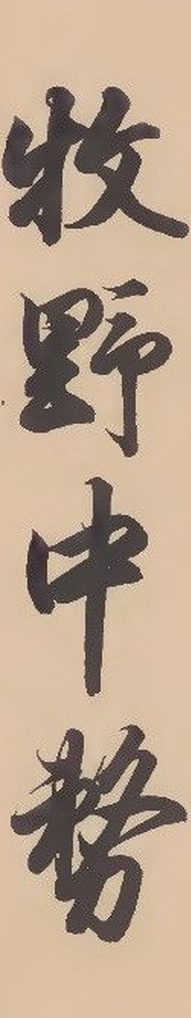牧野中務
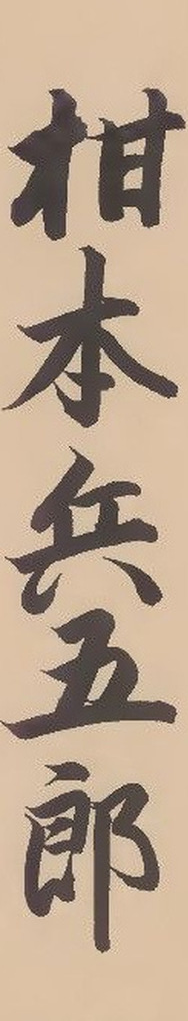柑本兵五郎
